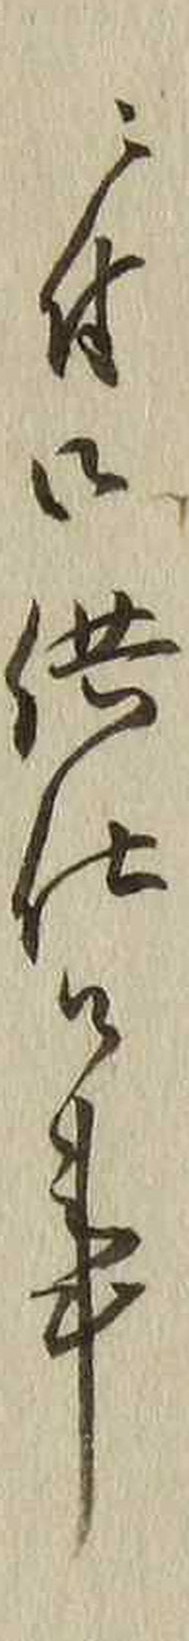ニ付御供仕候事
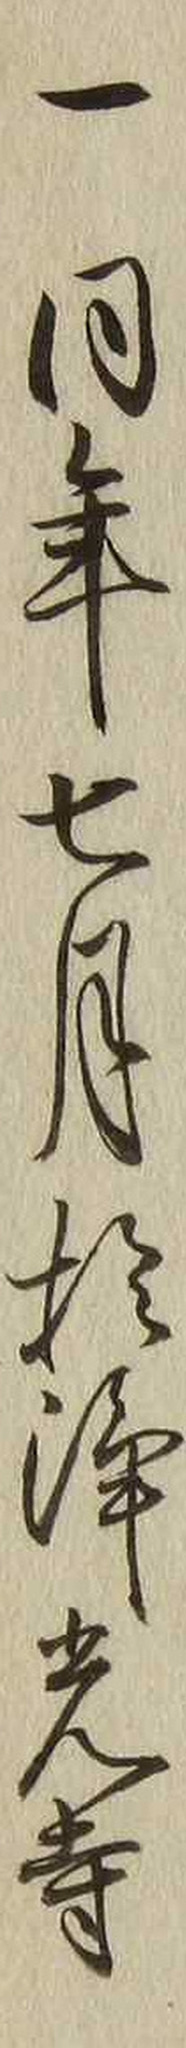一同年七月於浄光寺
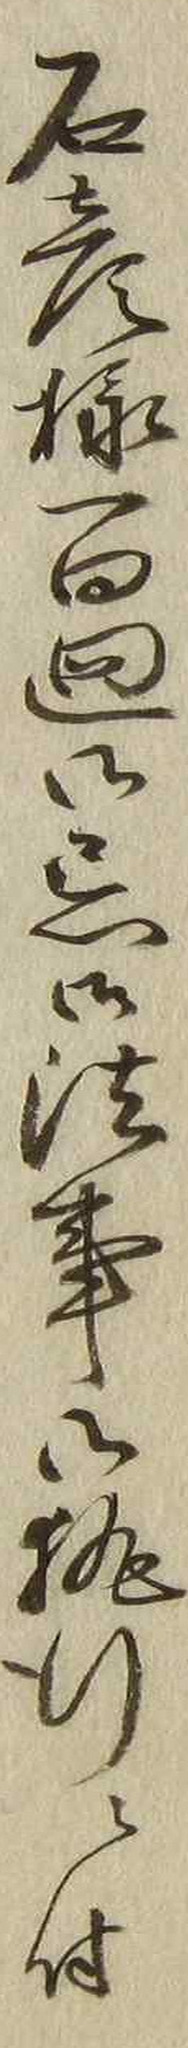石彦様百廻御忌御法事御執行ニ付
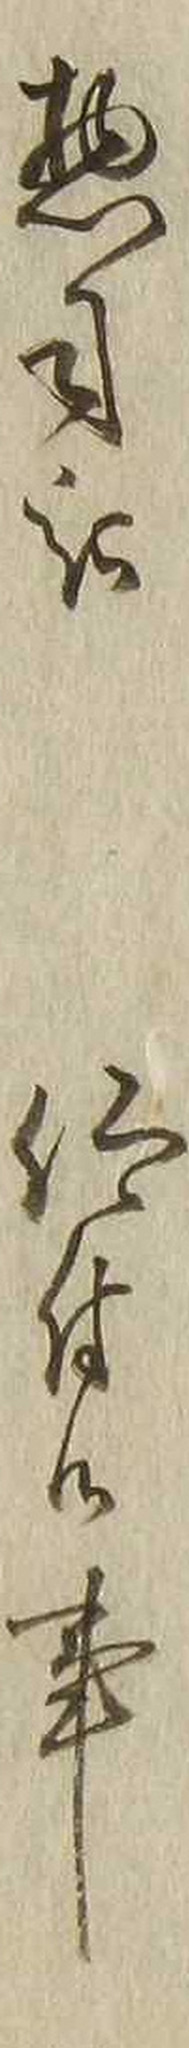惣司被仰付候事
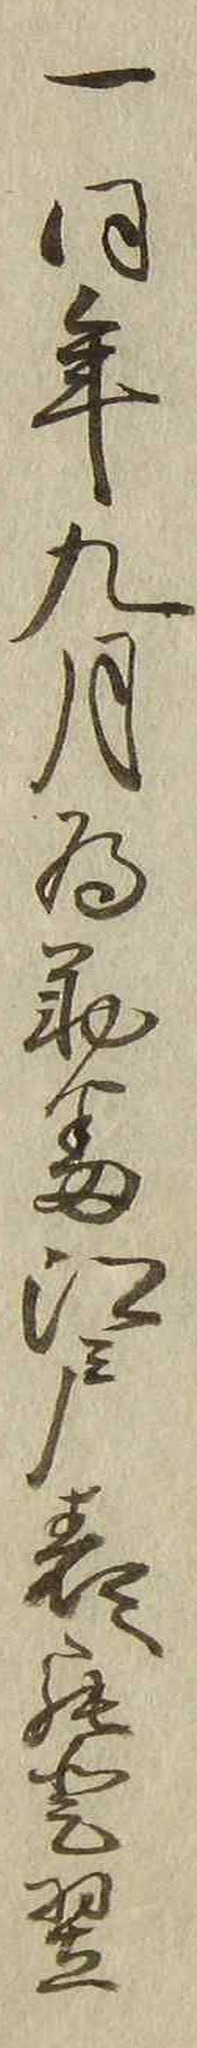一同年九月為勤番江戸表へ罷登翌
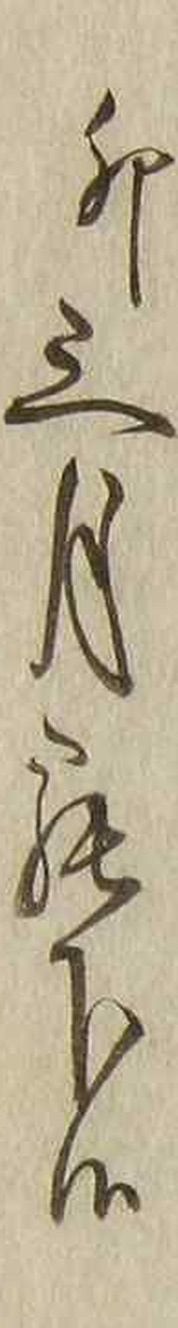卯三月罷下候

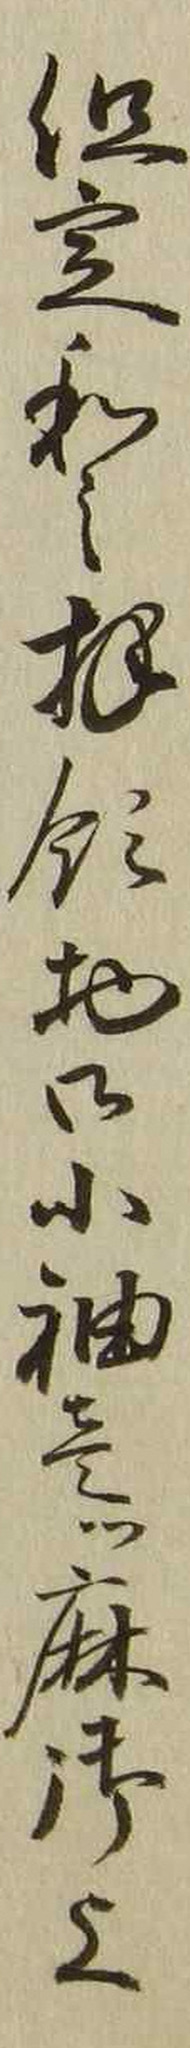但定和之拝領物御小袖壱ツ麻御上
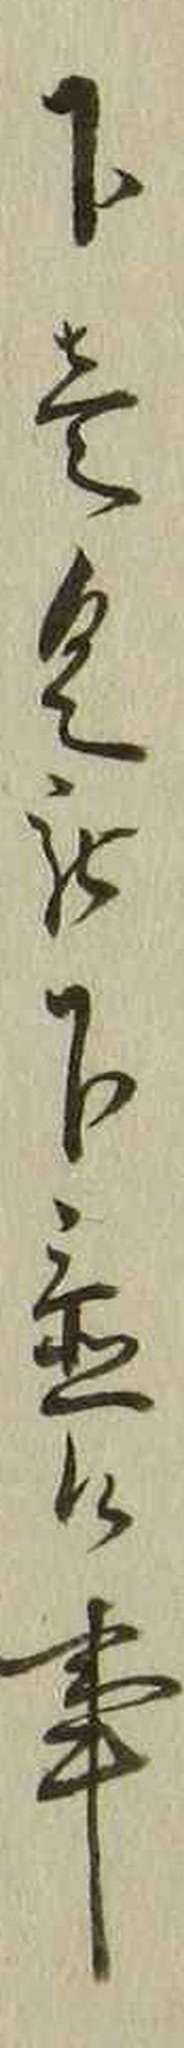下壱具被下置候事
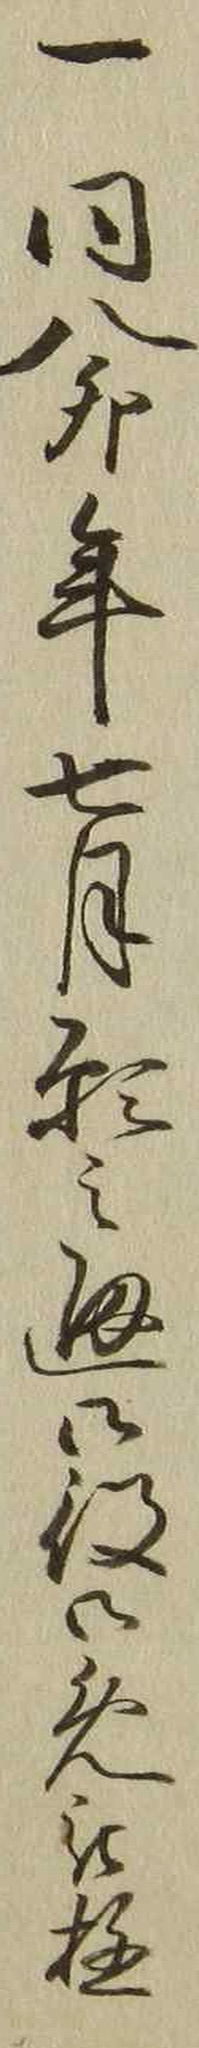一同八卯年七月願之通御役御免被遊
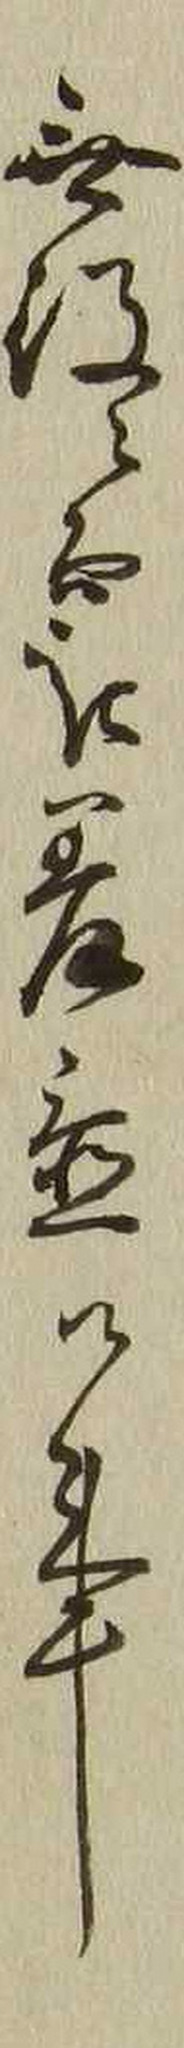無役ニ而被差置候事
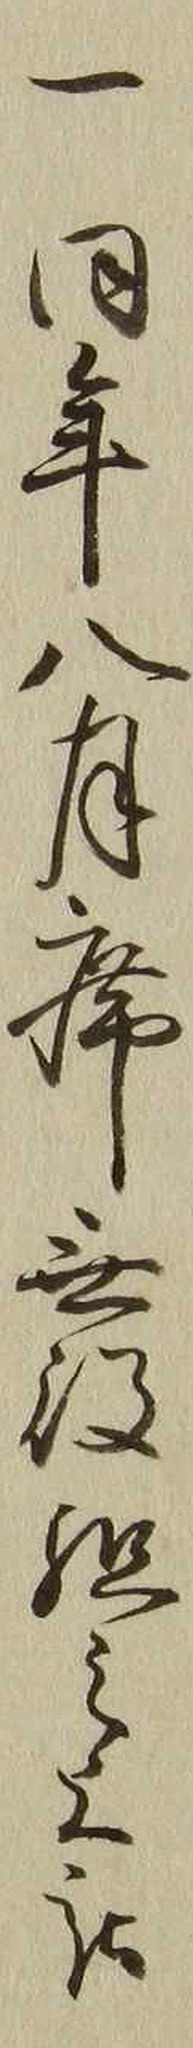一同年八月席無役組之上被
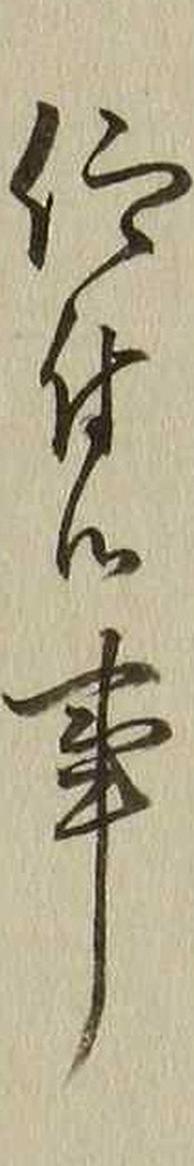仰付候事
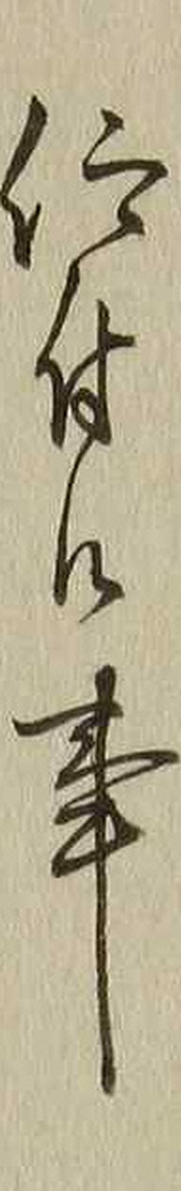仰付候事
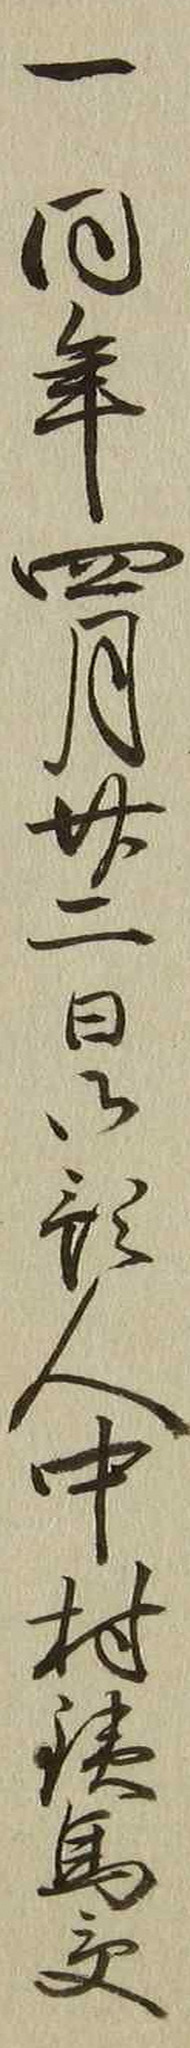一同年四月廿二日御預人中村鉄馬受
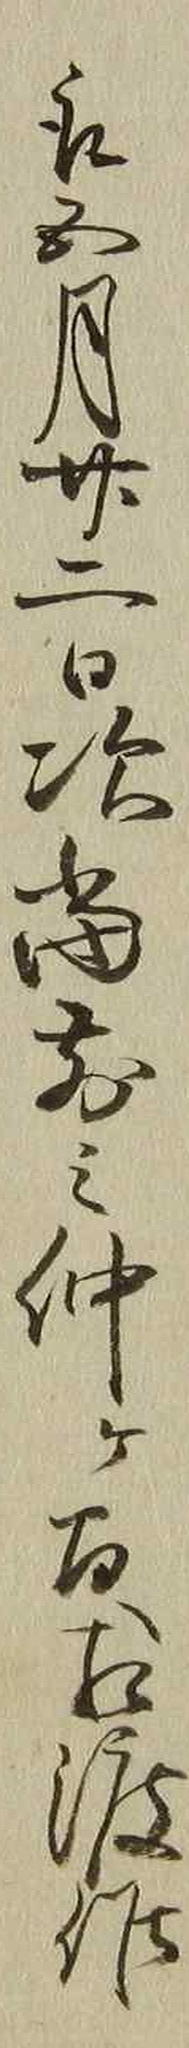取五月廿二日次当前之仲ヶ間へ相渡候
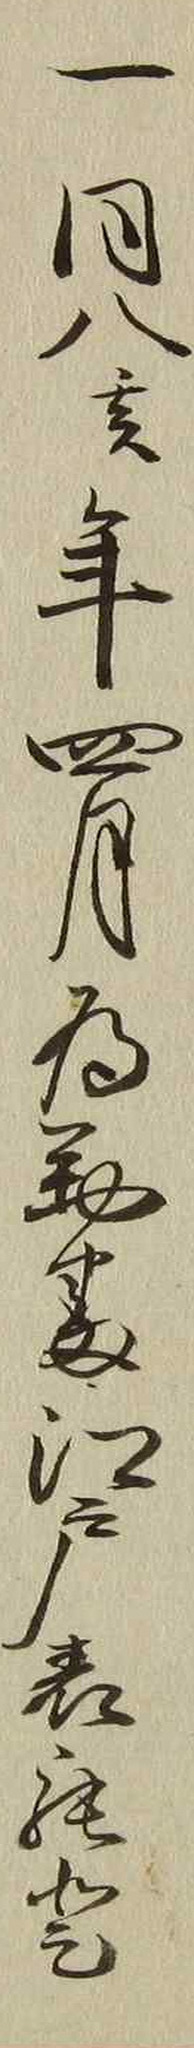一同八亥年四月為勤番江戸表罷登
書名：諸士系譜　巻之60　と之部3
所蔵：会津若松市立会津図書館
